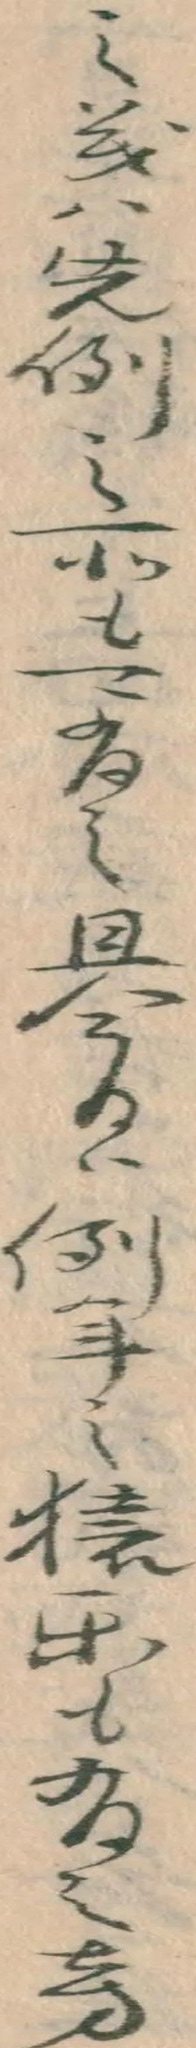之義ハ先例之所も可有之且今日ハ例年之猿楽も有之旁
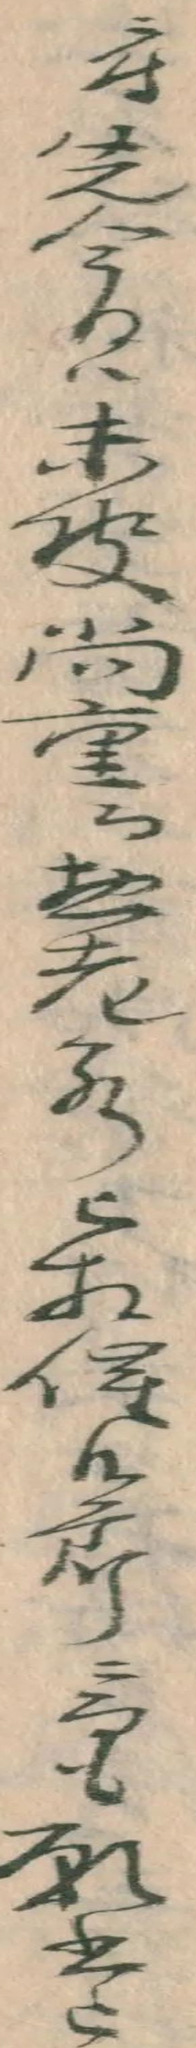に付先今日は未決尚重而惣老若被相催候節に而も願書被
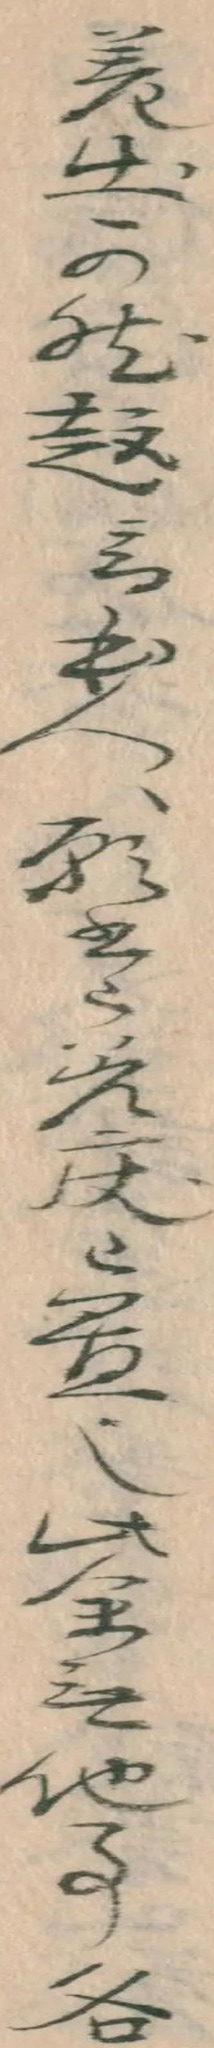差出可然趣に而本人へ願書被差戻被置也此余無他事各
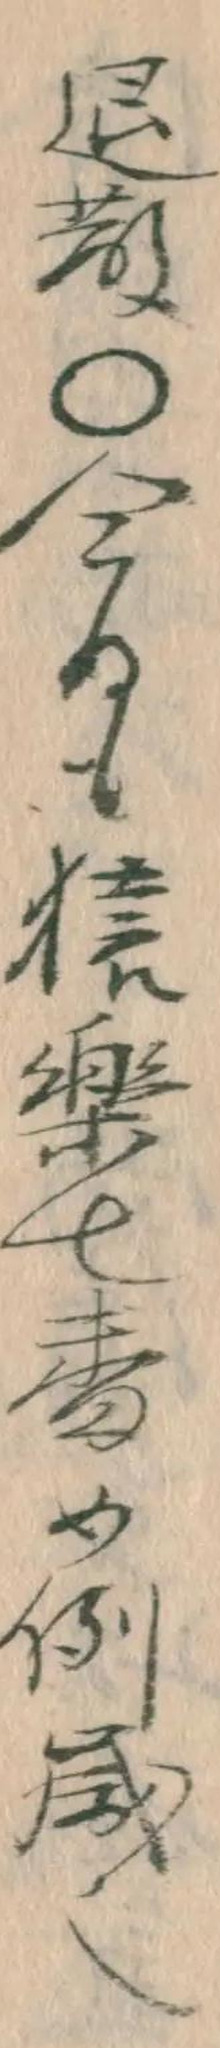退散○今日も猿楽七番如例歳也
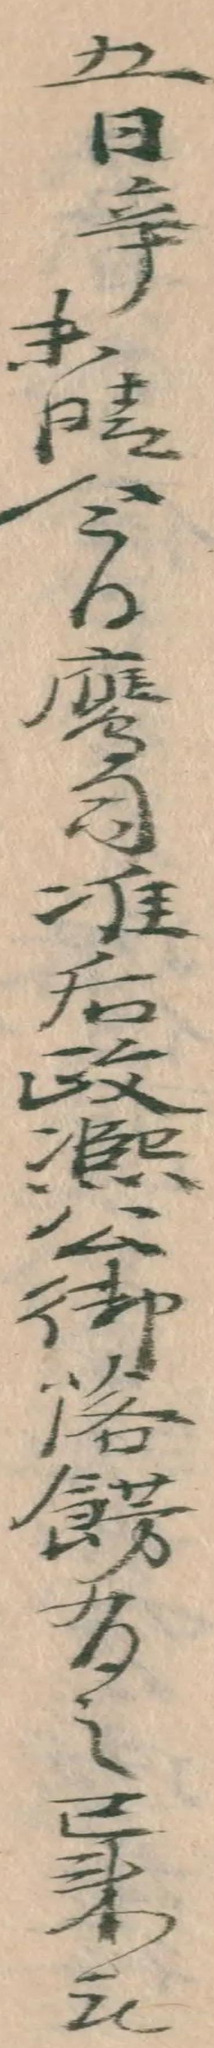五日辛未晴今日鷹司准后政凞公御落餝有之已来被
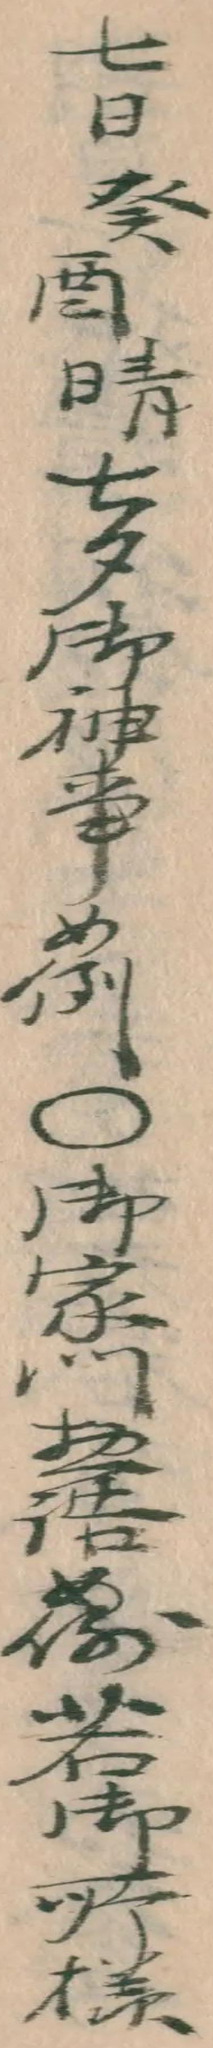七日癸酉晴七夕御神事如例〇御家門惣詰如例若御所様
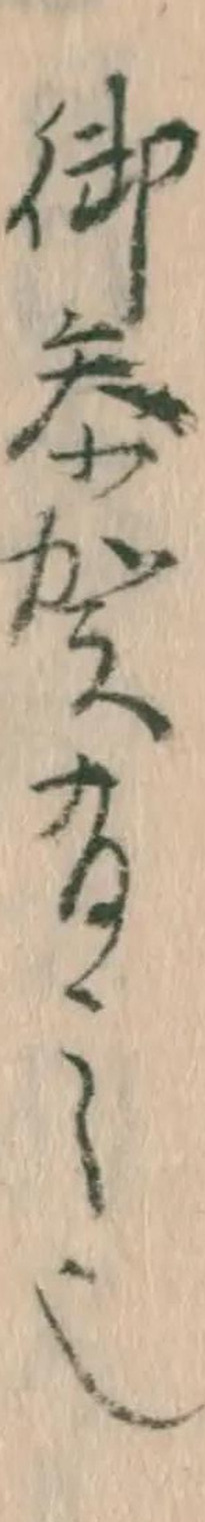御参賀有之也
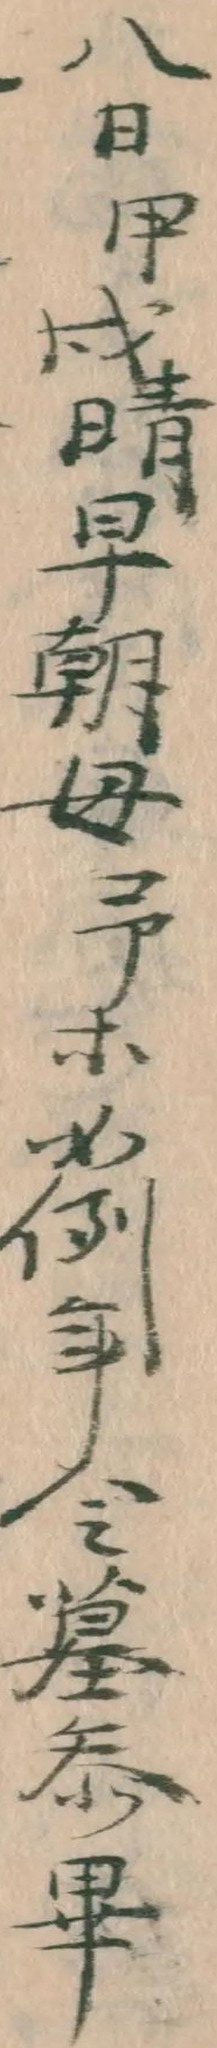八日甲戌晴早朝母予等如例年令墓参畢
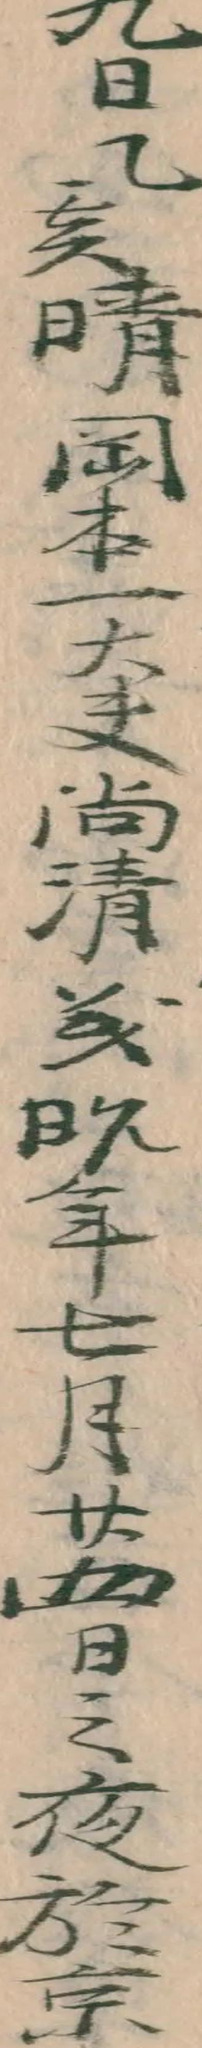九日乙亥晴岡本一大夫尚清義昨年七月廿四日之夜於京
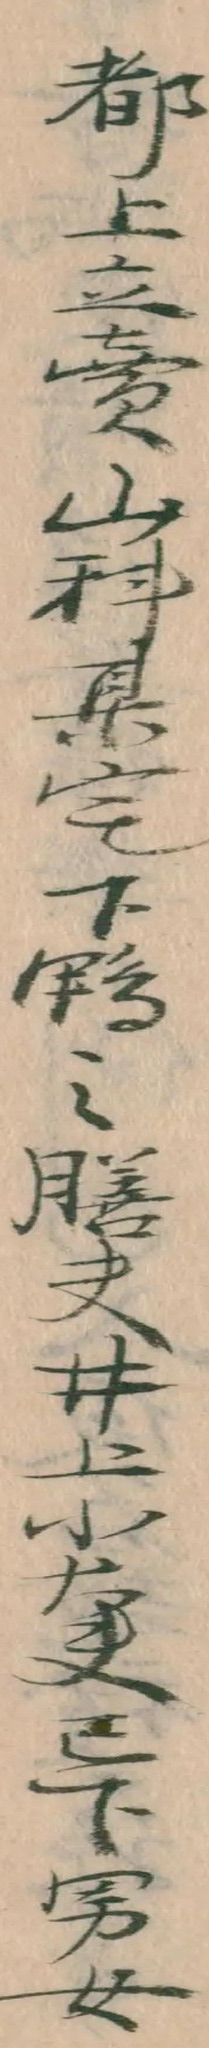都上立売山科某宅下鴨之膳夫井上小大夫已下男女
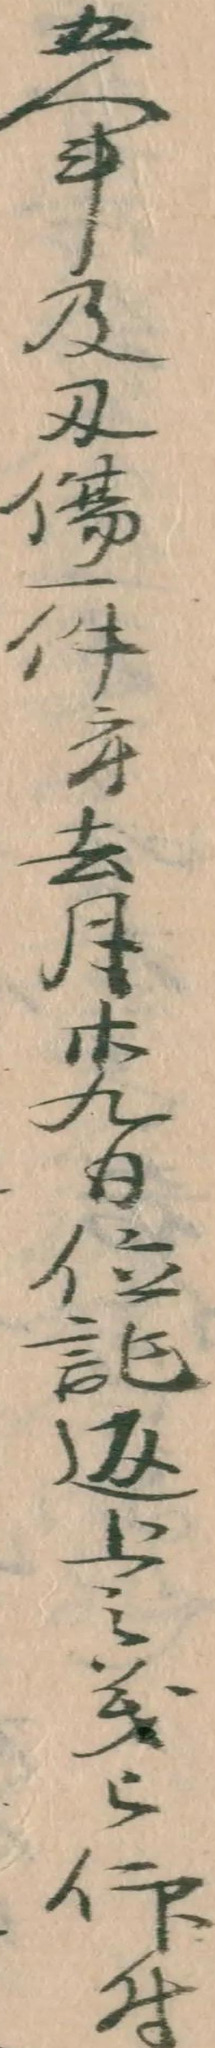五人計及刃傷一件に付去月廿九日位記返上之義被仰付
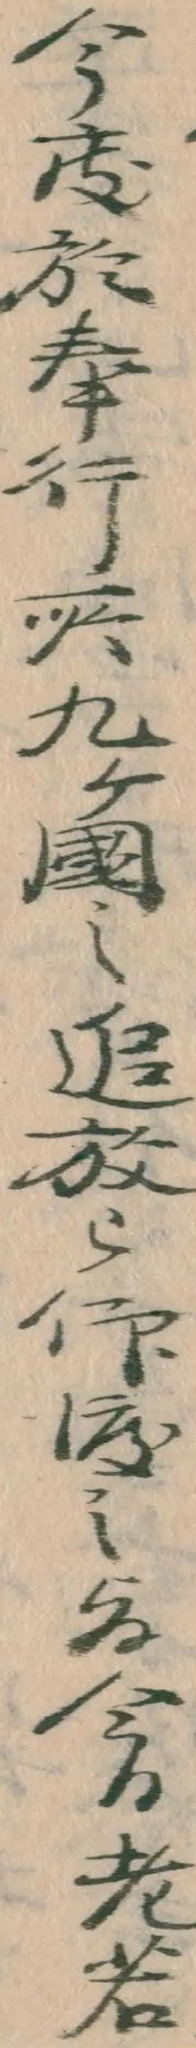今度於奉行所九ヶ国之追放被仰渡之旨今日老若へ
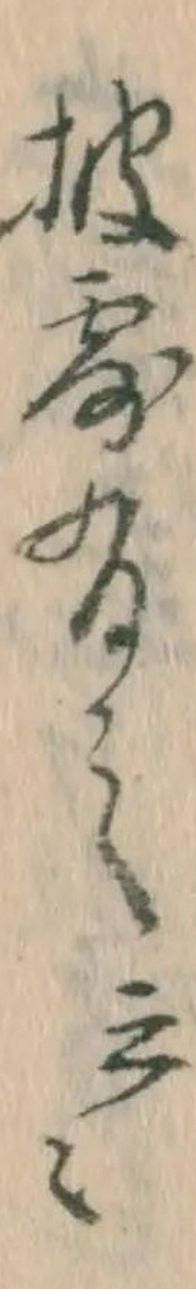披露有之云々
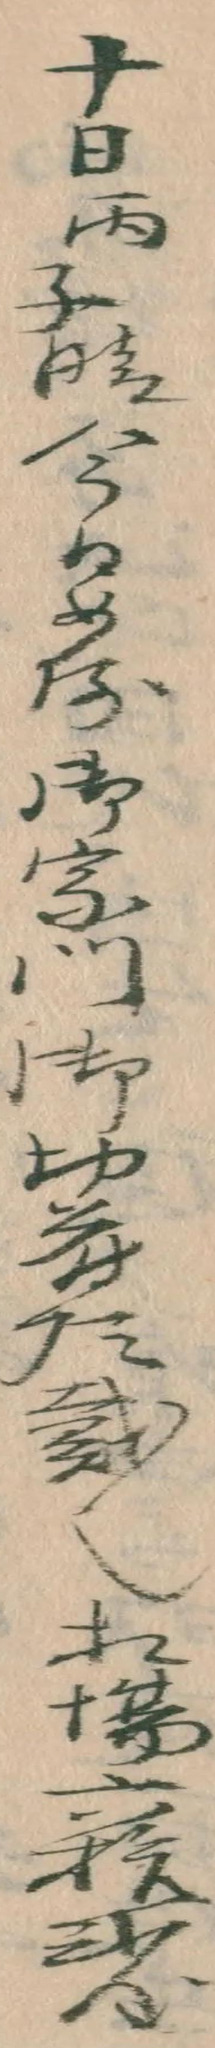十日丙子晴今日如例御家門御切符頂戴也相場六拾弐匁
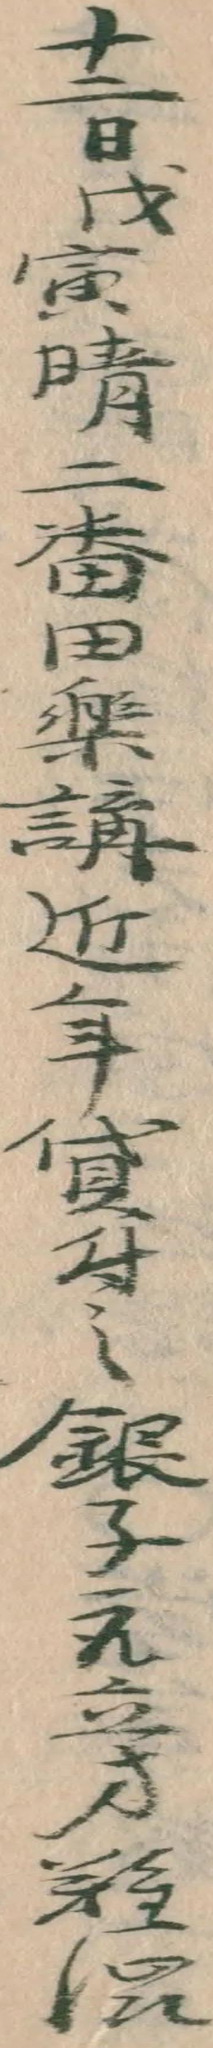十二日戊寅晴二番田楽講近年貸付之銀子取立方難渋
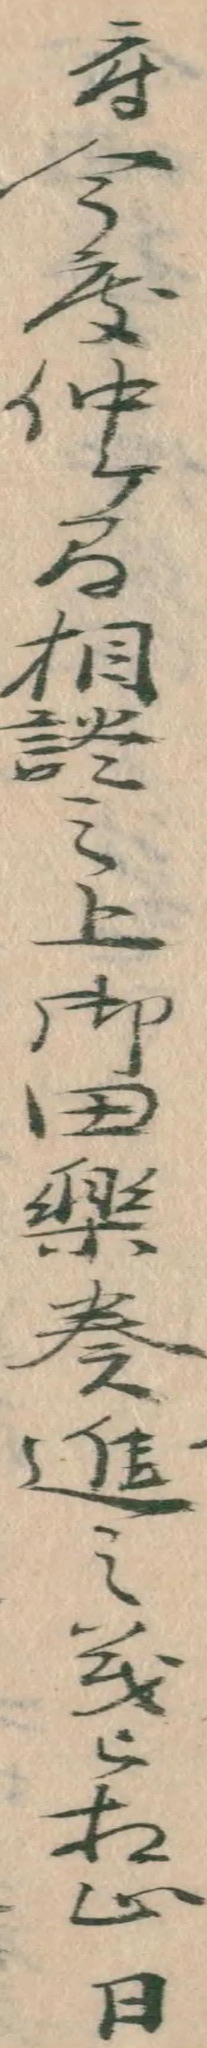に付今度仲ヶ間相談之上御田楽奏進之義被相止日
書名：賀茂社記録. 第64冊
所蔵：国立国会図書館 National Diet Library, JAPAN
